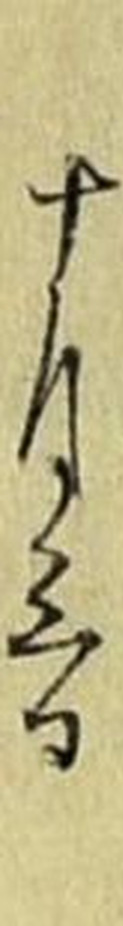十月三日
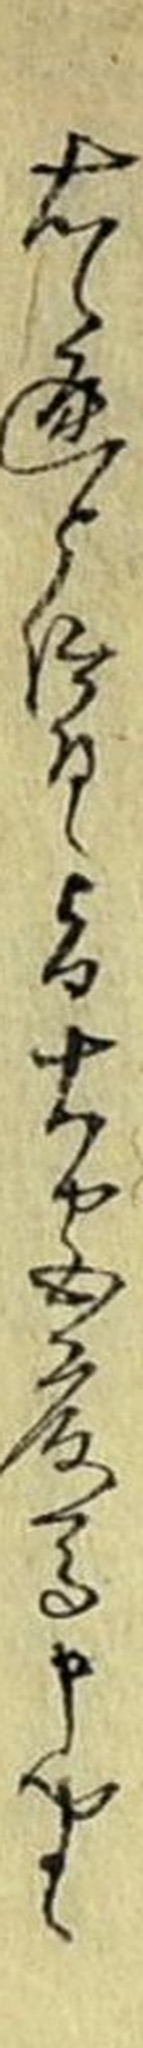右之通被仰付候旨大宮藤馬申聞候
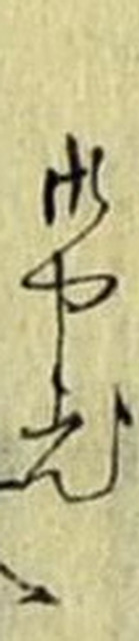御中老
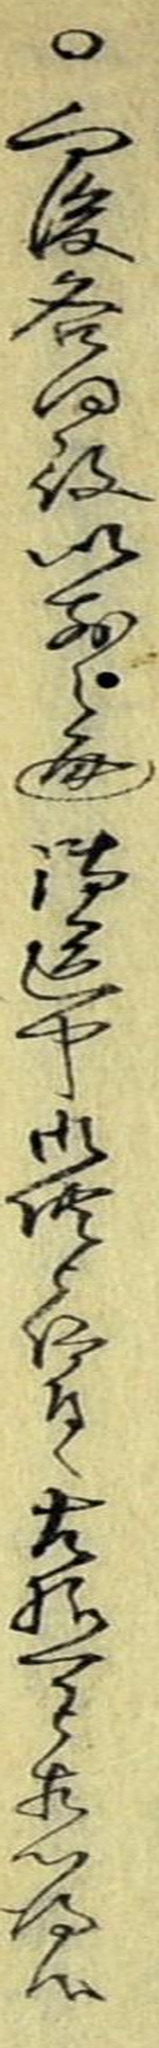○向後各同役以前之通御道中御供被仰付候左様可被相心得候

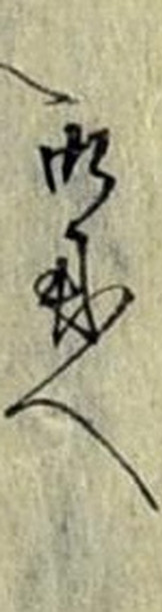御用人
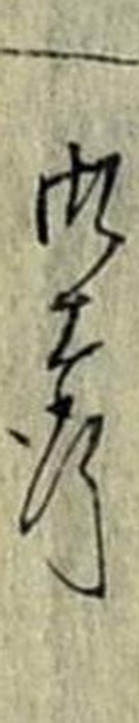御奉行
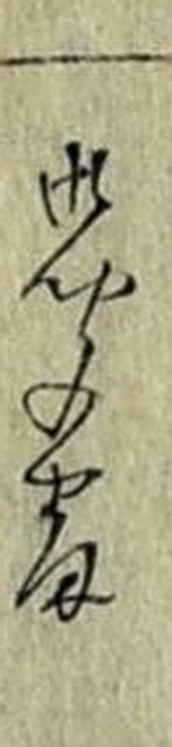御聞番
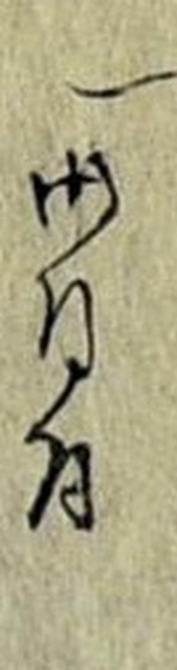御目付
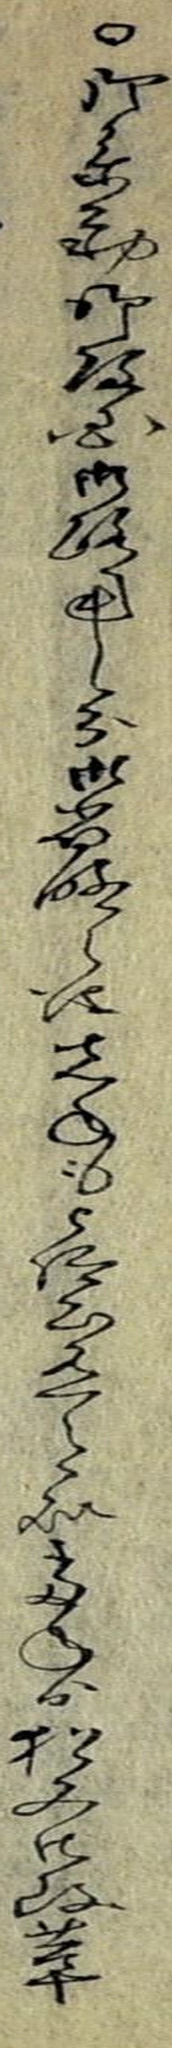○御参勤御帰国御路用之分御省略之儀先年も被仰出有之候処当年ゟ猶又御改革
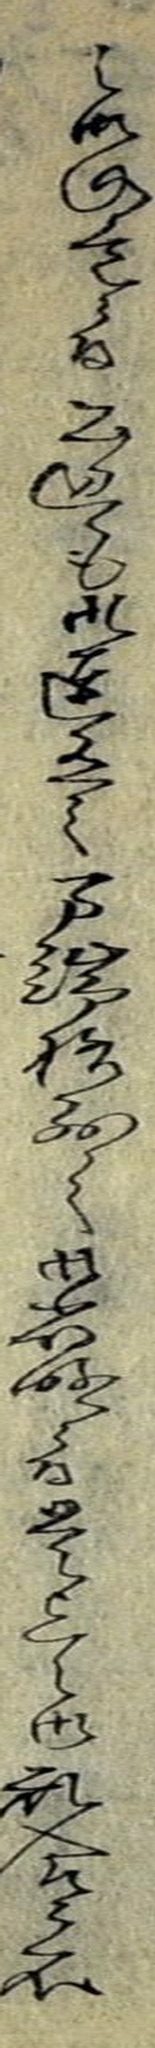之御趣意ニ付公辺へも御達有之万端格別之御省略ニ付是迄之御形合ニ不
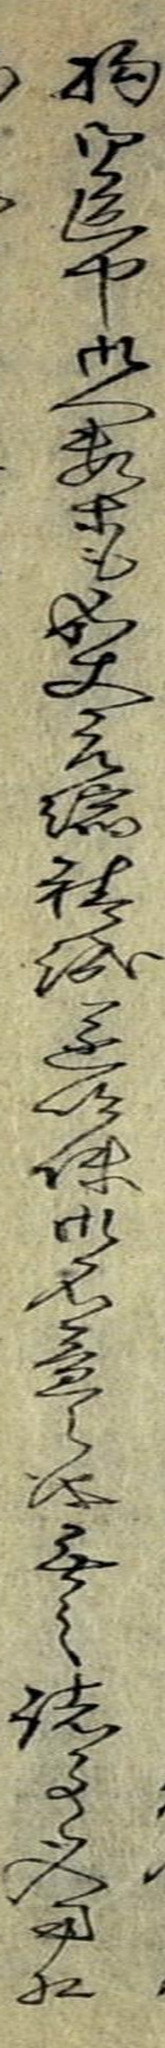拘御道中御人数等も成丈取縮精誠遂吟味御不益之儀無之諸事御入用相
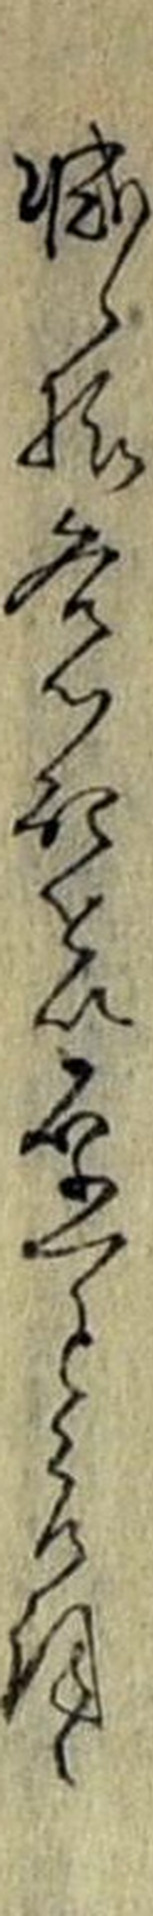減候様各心配を以厚可被取調候
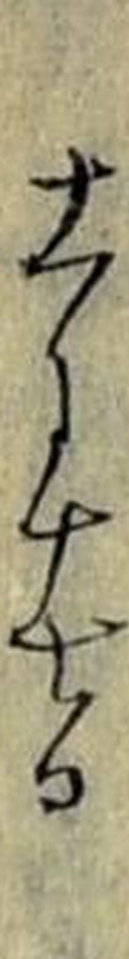十一月十七日
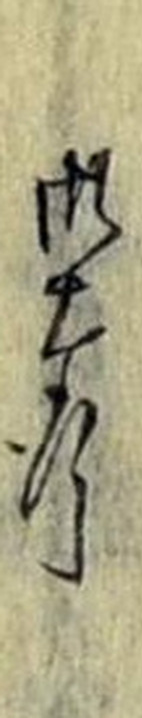御奉行
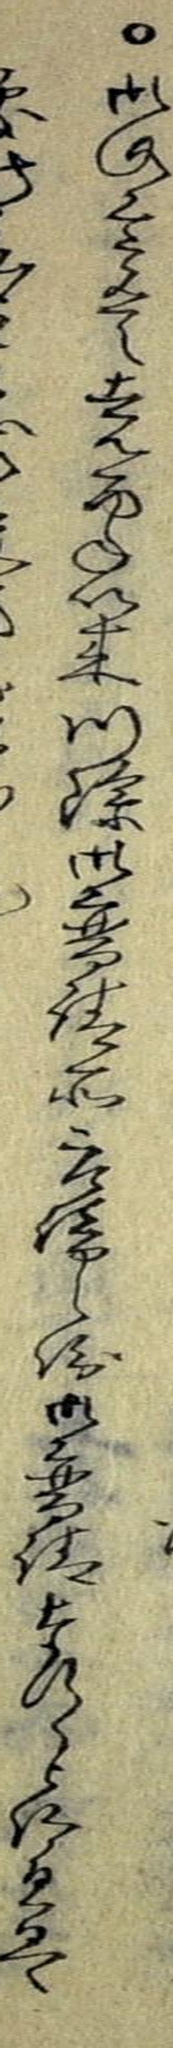○御趣意有之去ル酉年以来川除御普請所取締之儀御普請奉行へ被仰付置候
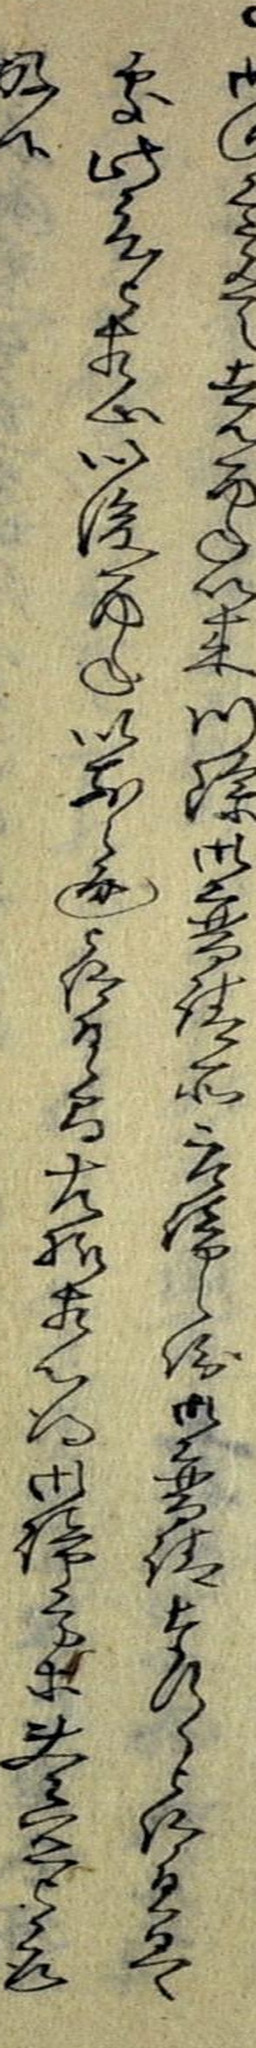処此度被相止以後酉年以前之通被仰付候間左様相心得御締方等夫々宜被取
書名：命令之部 五
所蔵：福井県文書館 Fukui Prefectural Archives
